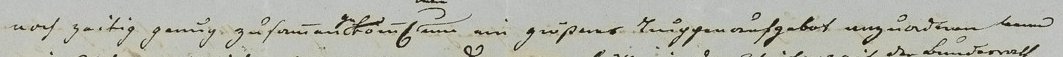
noch zeitig genug zusammengekommen wäre um ein größeres Truppenaufgebot anzuordnen wenn
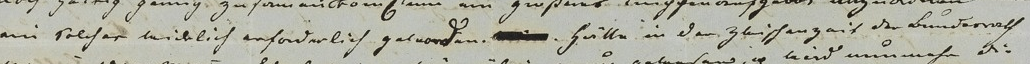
ein Solches wirklich erforderlich geworden. ... Hätte in der Zwischenzeit der Bundesrath
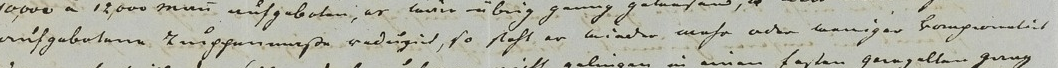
aufgebotene Truppenmaße reduzirt, so steht er wieder, mehr oder weniger komprometirt
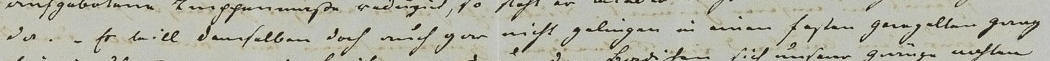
da. – Es will demselben doch auch gar nicht gelingen in einen festen geregelten Gang
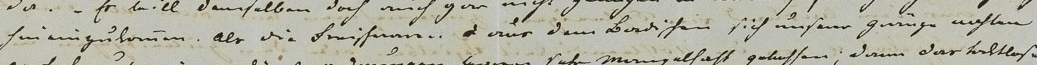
hinein zukommen. Als die Freischaaren u aus dem Badischen sich unsrer Gränze nahten
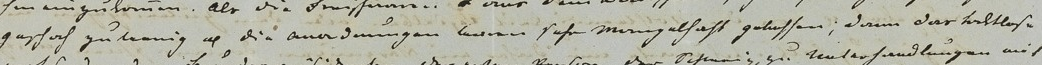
geschah zu wenig u die Anordnungen waren sehr mangelhaft getroffen; dann das taktlose
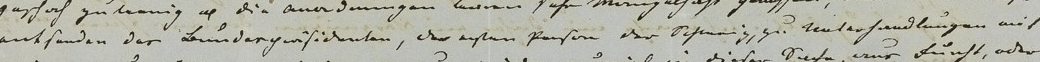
entsenden des Bundespräsidenten, der ersten Person der Schweiz, zu Unterhandlungen mit
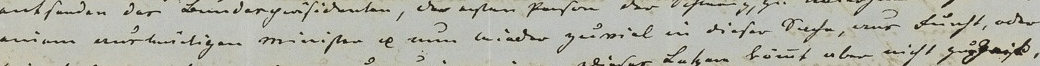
einem auswärtigen Minister u nun wieder zuviel in dieser Sache, aus Furcht, oder
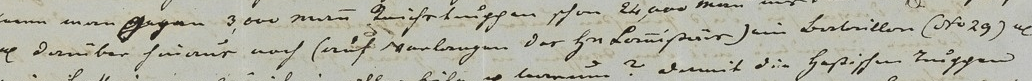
u darüber hinaus noch (auf Verlangen des Hrn Commißärs) ein Bataillon (No 29) u
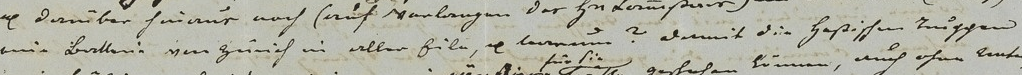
eine Batterie von Zürich in aller Eile, u warum? damit die Heßischen Truppen
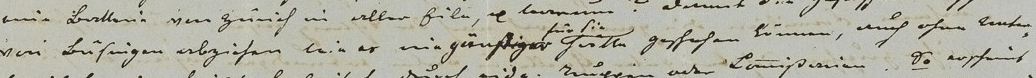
von Büsingen abziehen wie es nie günstiger für sie hätte geschehen können, auch ohne Unter-
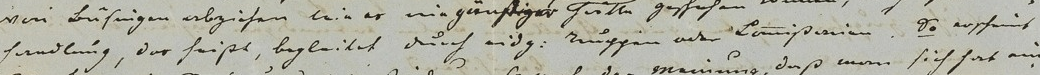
handlung, das heißt, begleitet durch eidg: Truppen oder Commißarien. So erscheint
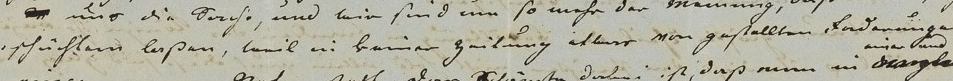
schüchtern laßen, weil in keiner Zeitung etwas von gestellten Forderungen
